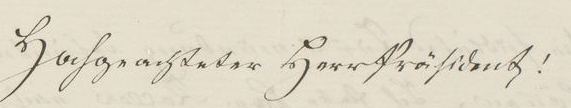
Hochgeachteter Herr Präsident!
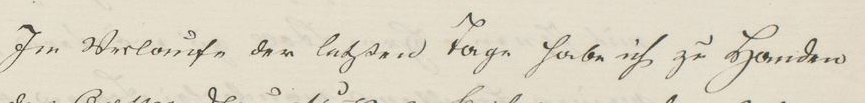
Im Verlaufe der letzten Tage habe ich zu Handen
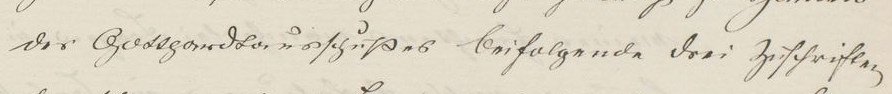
des Gotthardtausschußes beifolgende drei Zuschriften
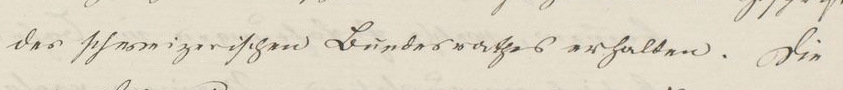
des schweizerischen Bundesrathes erhalten. Die
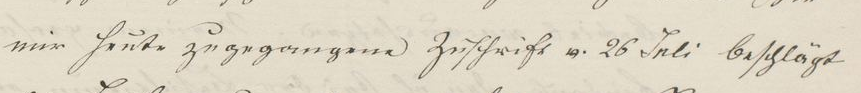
mir heute zugegangene Zuschrift v. 26 Juli beschlägt
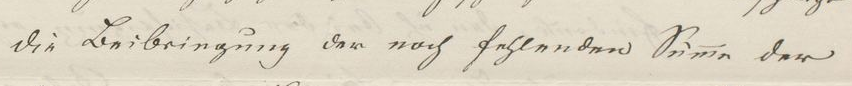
die Beibringung der noch fehlenden Summe der
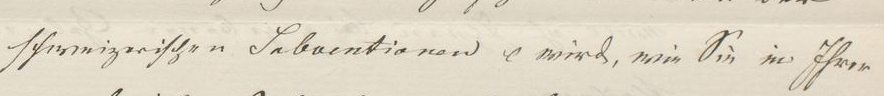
schweizerischen Subventionen & wird, wie Sie in Ihrer
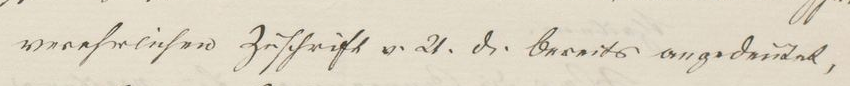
verehrlichen Zuschrift v. 21.d. bereits angedeutet,
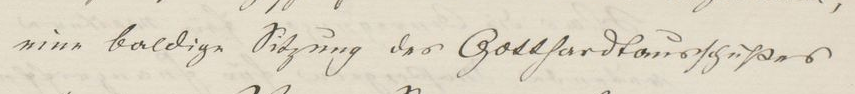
eine baldige Sitzung des Gotthardtausschußes
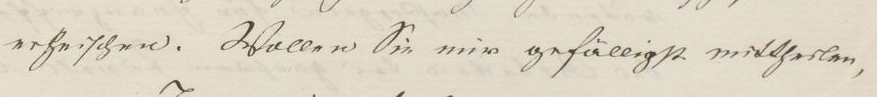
erheischen. Wollen Sie mir gefälligst mittheilen,
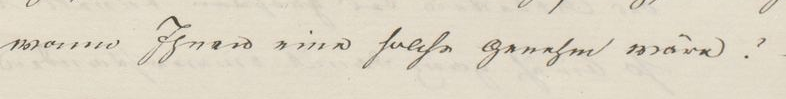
wann Ihnen eine solche genehm wäre? –
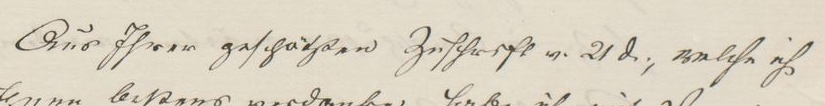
Aus Ihrer geschätzten Zuschrift v. 21d., welche ich
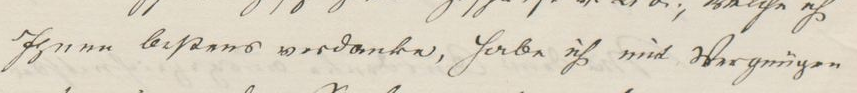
Ihnen bestens verdanke, habe ich mit Vergnügen
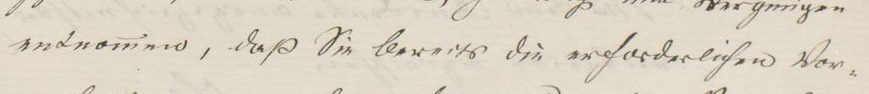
entnommen, daß Sie bereits die erforderlichen Vor-
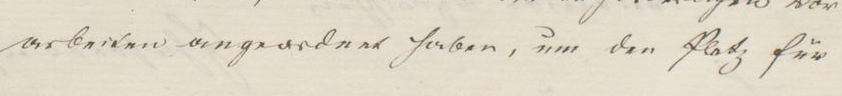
arbeiten angeordnet haben, um den Platz für
